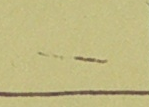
--
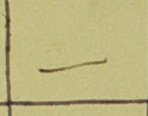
--
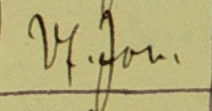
27. Jan.
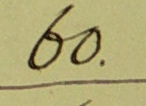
60
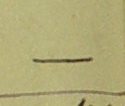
--
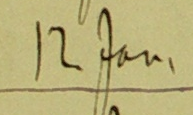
12. Jan.
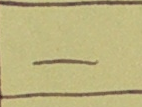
--
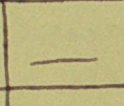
--
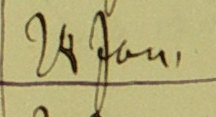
28. Jan.
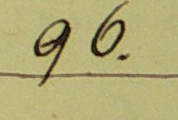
96
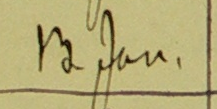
13. Jan.
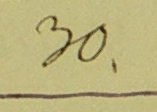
30
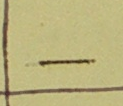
--
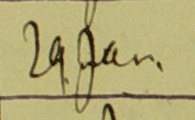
29. Jan.
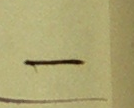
--
